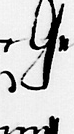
n.
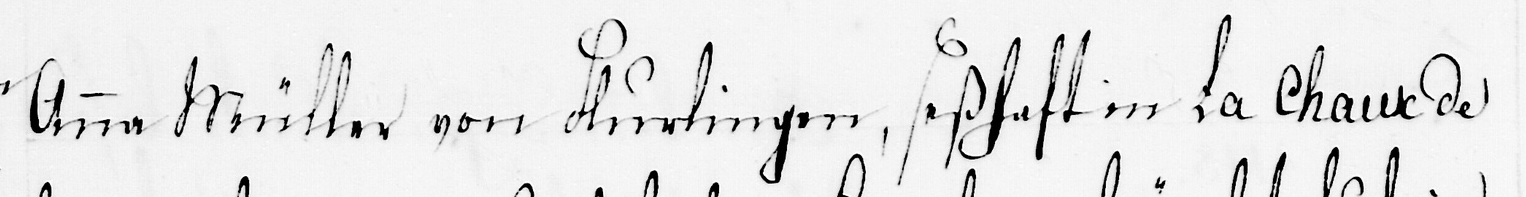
Anna Müller von Flurlingen, seßhaft in La Chaux de
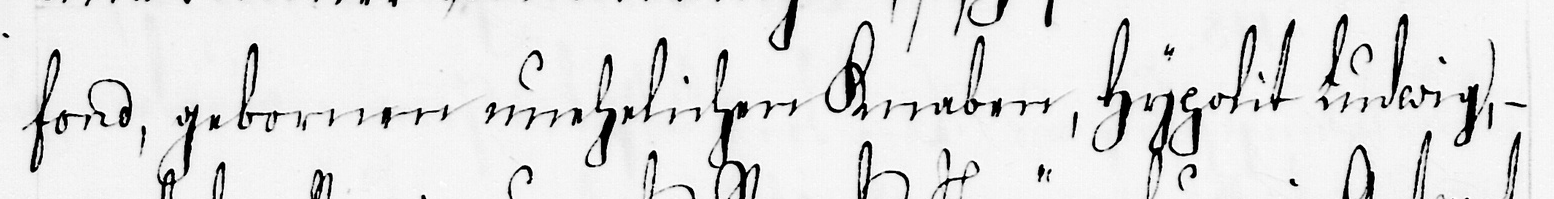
fond, gebornen unehelichen Knaben, Hypolit Ludwig, –
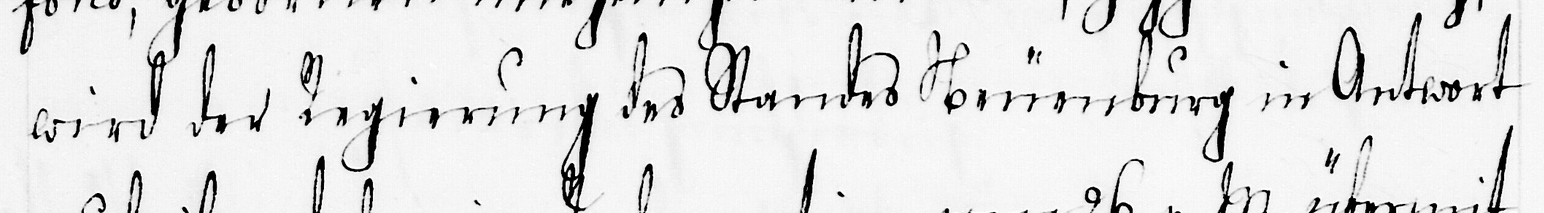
wird der Regierung des Standes Neuenburg in Antwort
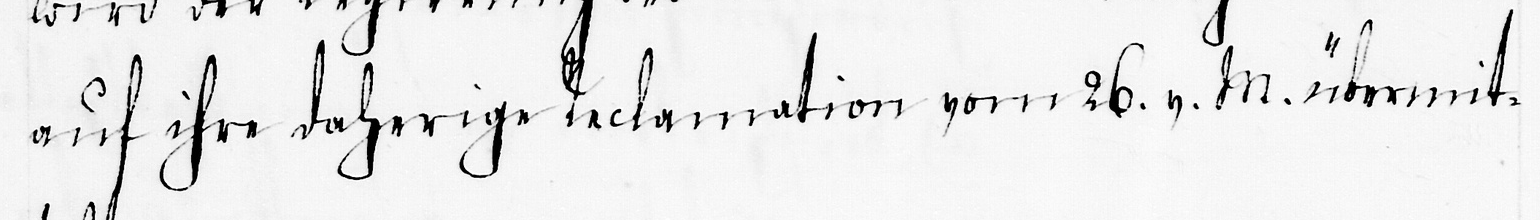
auf ihre daherige Reclamation vom 26. v. M. übermit¬
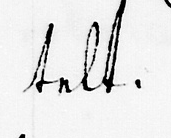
telt.
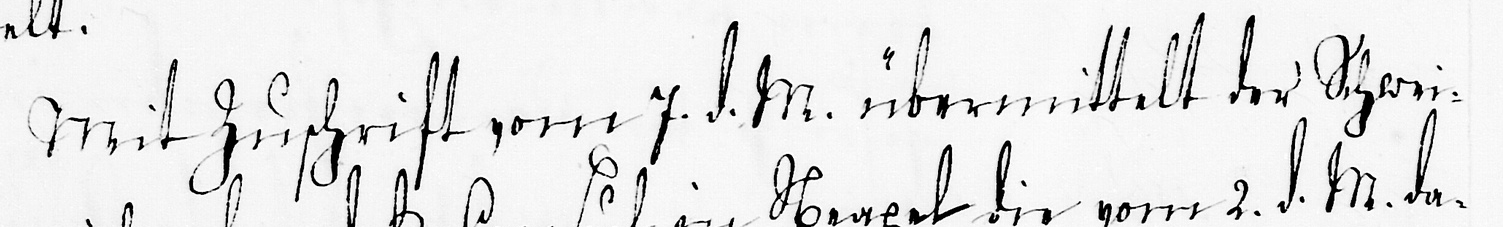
Mit Zuschrift vom 7. d. M. übermittelt der Schwei¬
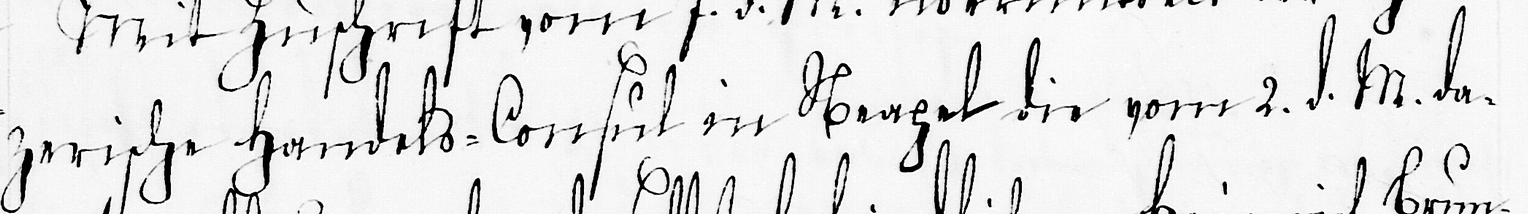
zerische Handels-Consul in Neapel die vom 2. d. M. da¬
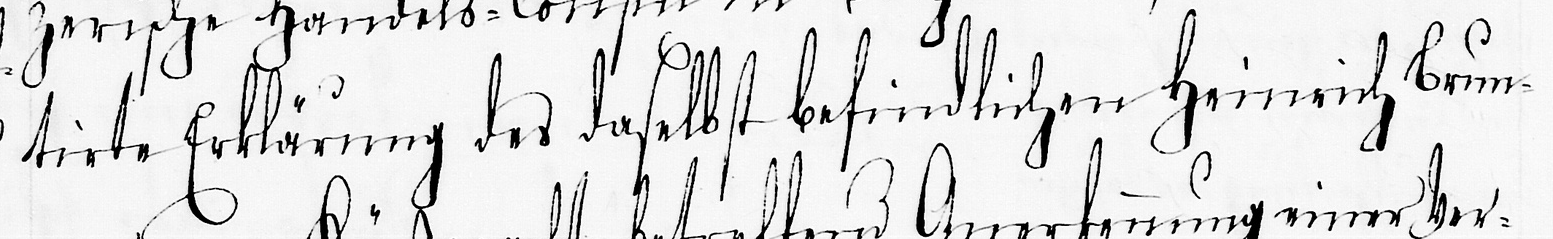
tirte Erklärung des daselbst befindlichen Heinrich Brun¬
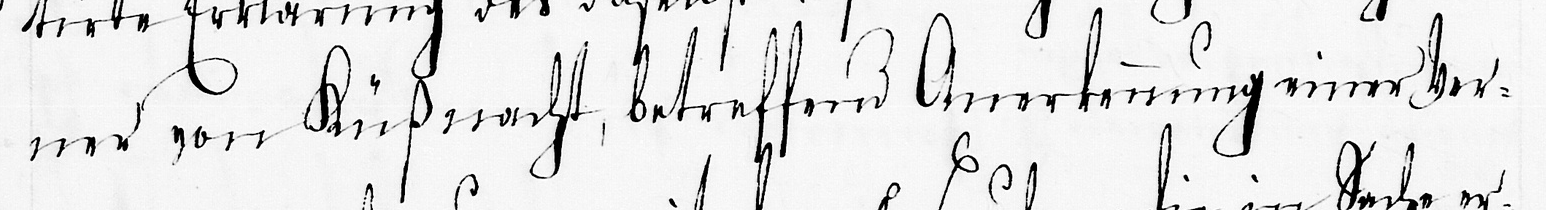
ner von Küßnacht, betreffend Anerkennung einer Ver¬
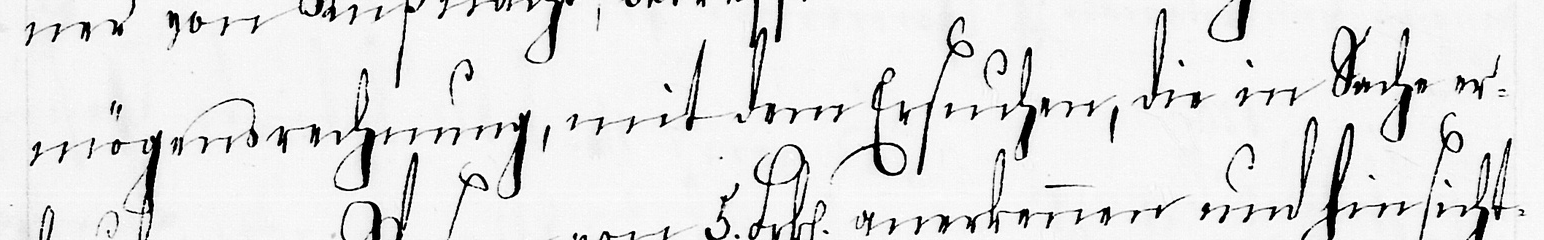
mögensrechnung, mit dem Ersuchen, die in Sache er¬
